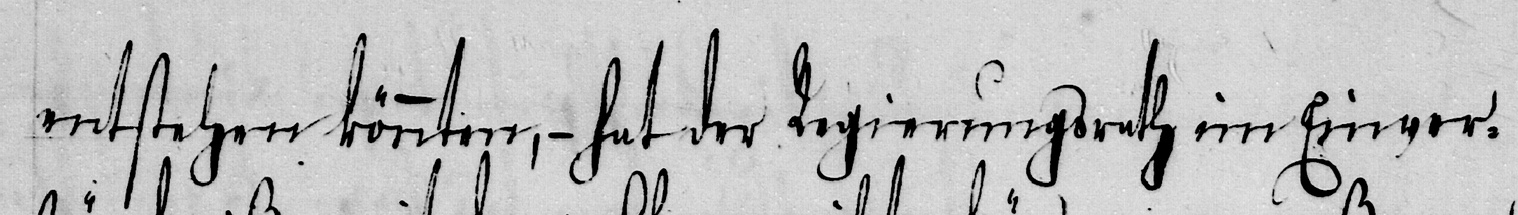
entstehen könnten, – hat der Regierungsrath im Einver¬
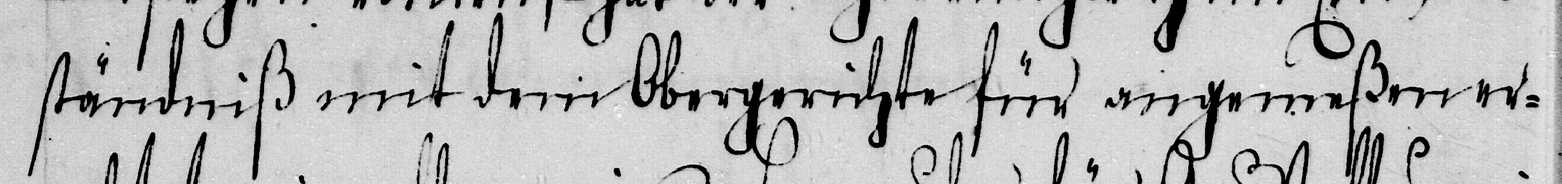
ständniß mit dem Obergerichte für angemeßen er¬
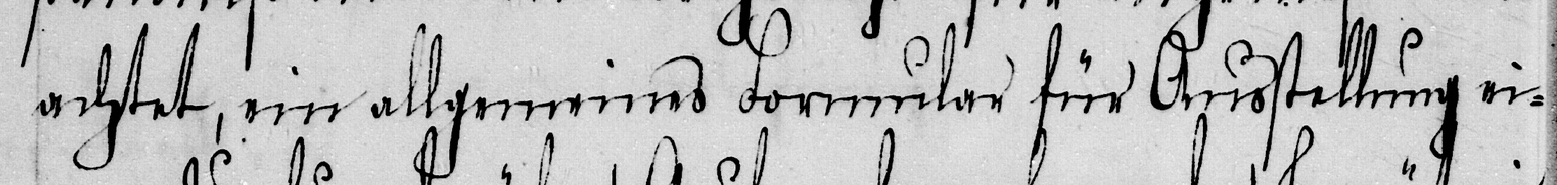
achtet, ein allgemeines Formular für Ausstellung ei¬
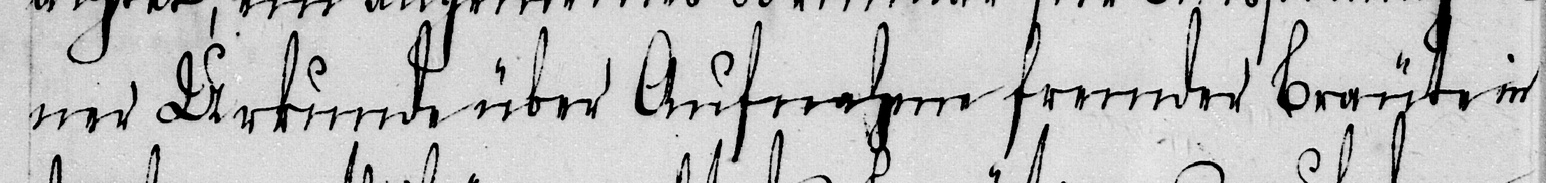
ner Urkunde über Aufnahme fremder Bräute
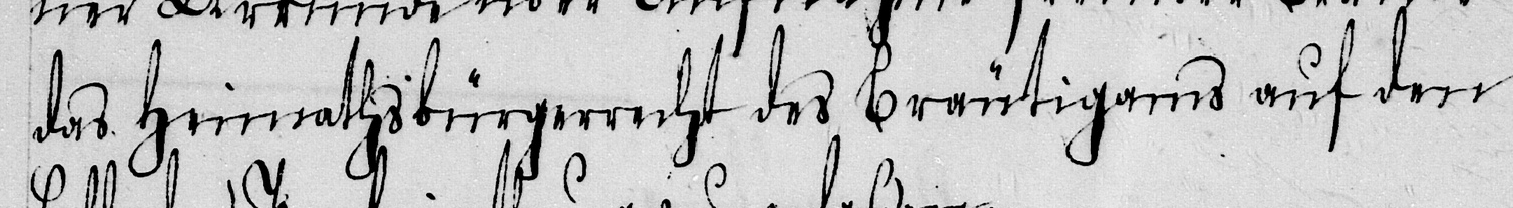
das Heimathsbürgerrecht des Bräutigams auf den
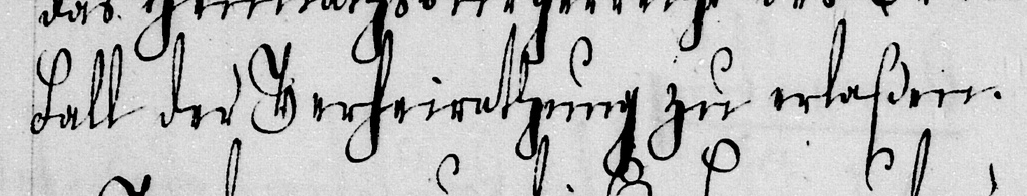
Fall der Verheirathung zu erlaßen.
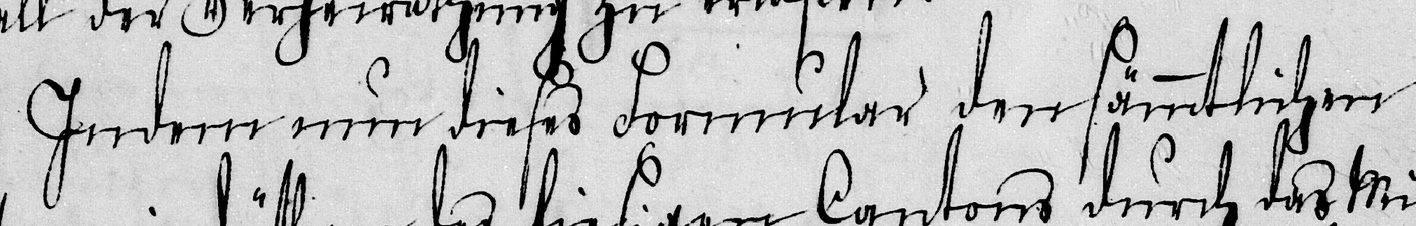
Indem nun dieses Formular den sämmtlichen
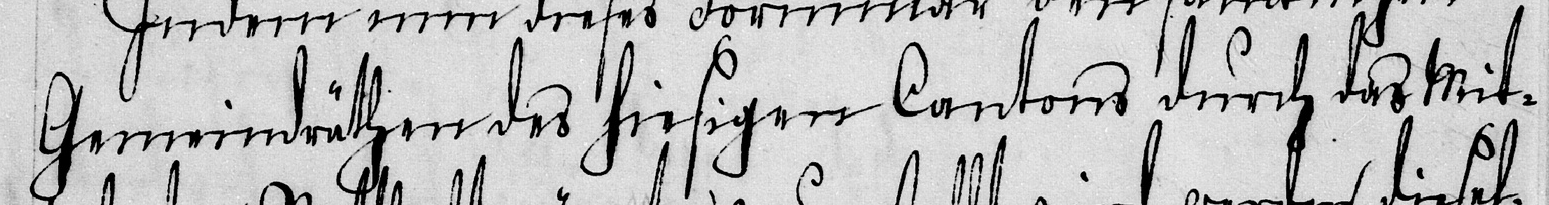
Gemeindräthen des hiesigen Cantons durch das Mit¬
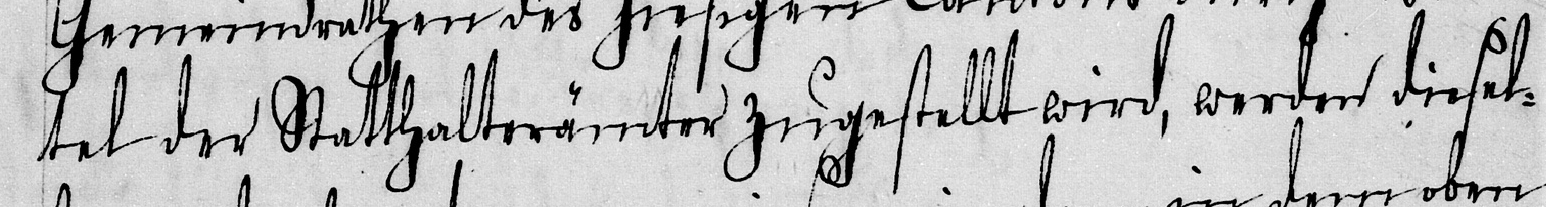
tel der Statthalterämter zugestellt wird, werden diesel¬
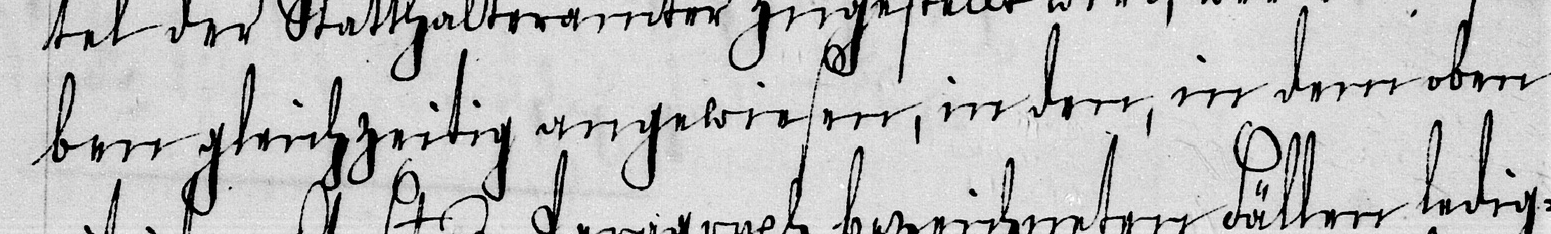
ben gleichzeitig angewiesen, in den, in dem oben
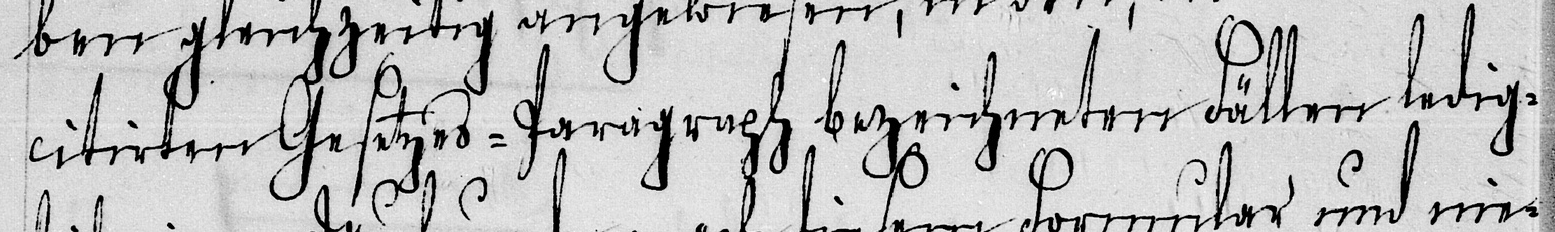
citirten Gesetzes-Paragraph bezeichneten Fällen ledig¬
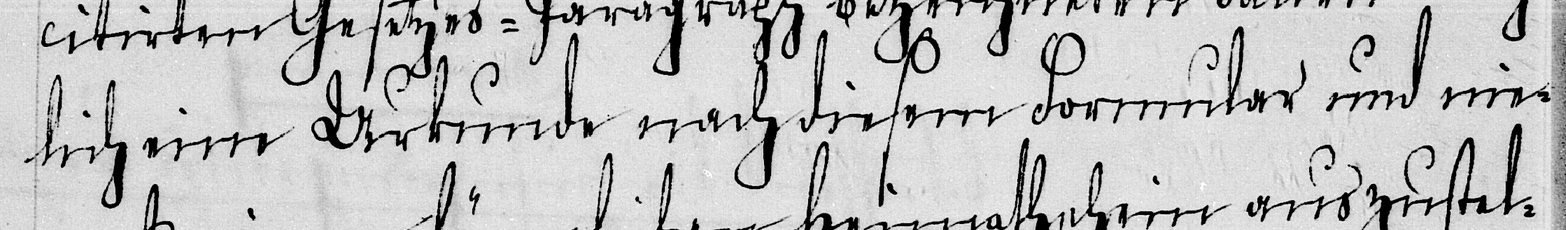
lich eine Urkunde nach diesem Formular und nie¬
